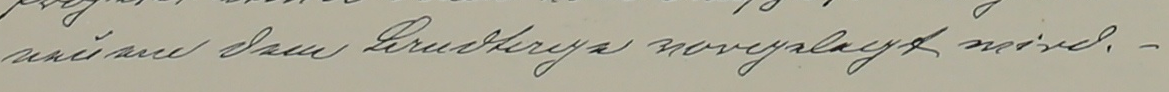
neuem dem Landtage vorgelegt wird.
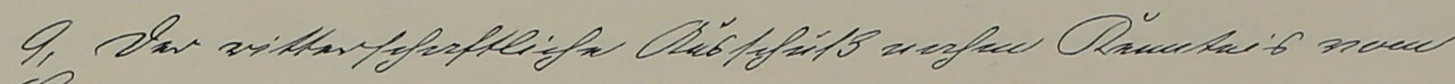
9. Der ritterschaftliche Ausschuß nahm Kenntnis vom
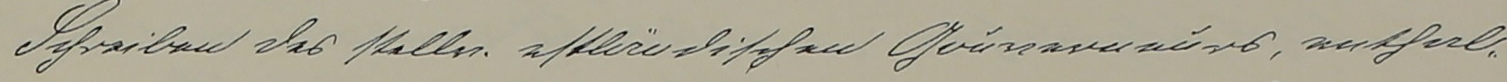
Schreiben des stellv. estländischen Gouverneurs, enthal-
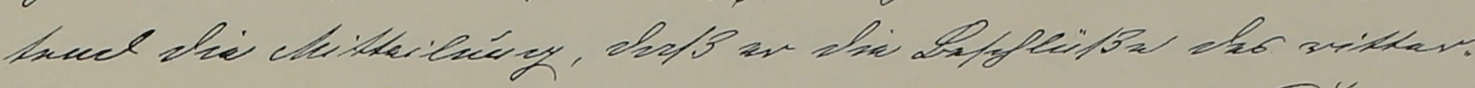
tend die Mitteilung, daß er die Beschlüße des ritter-
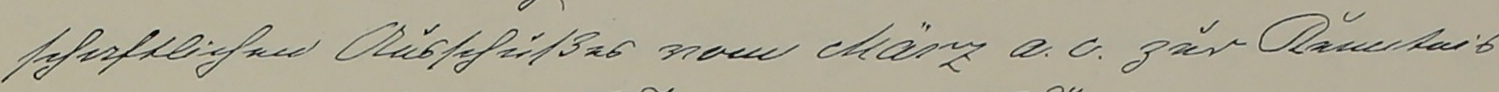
schaftlichen Ausschußes vom März a.c. zur Kenntnis
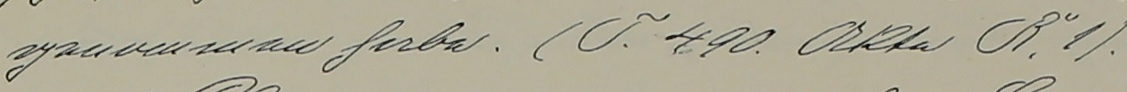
genommen habe. (T.490. Akte R.1).
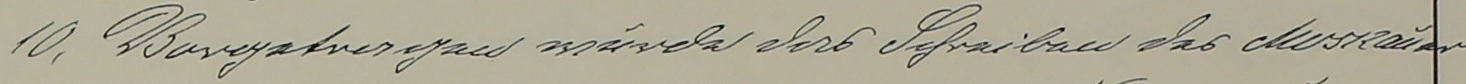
10. Vorgetragen wurde das Schreiben des Moskauer
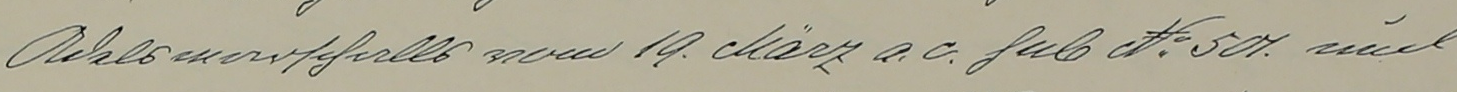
Adelsmarschalls vom 19. März a.c. sub No. 501 und
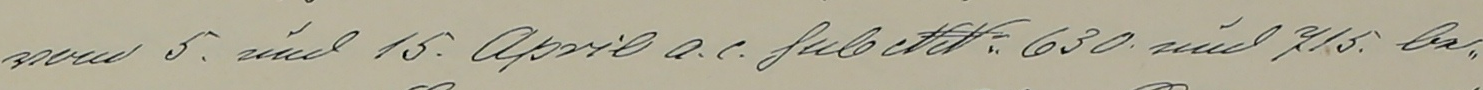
vom 5. und 15. April a.c. sub NNo. 630 und 715. be-
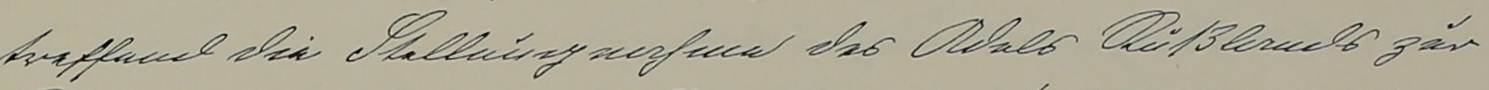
treffend die Stellungnahme des Adels Rußlands zur
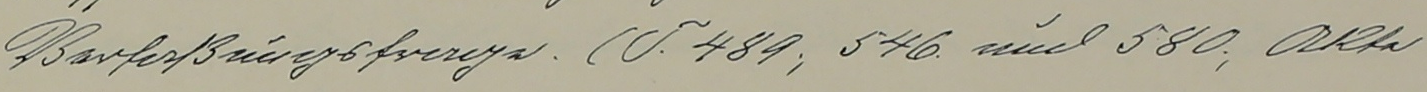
Verfaßungsfrage. (T. 489, 546. und 580; Akte
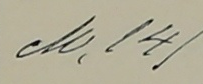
M.14).
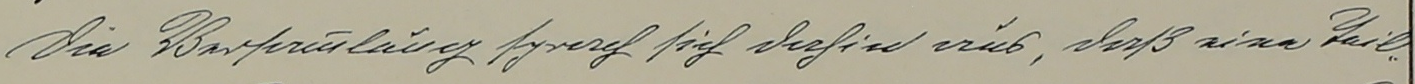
Die Versammlung sprach sich dahin aus, daß eine Teil-
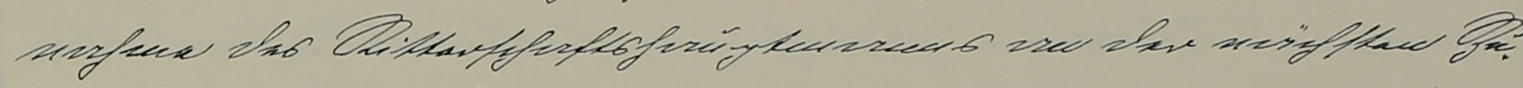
nahme des Ritterschaftshauptmanns an der nächsten Zu-
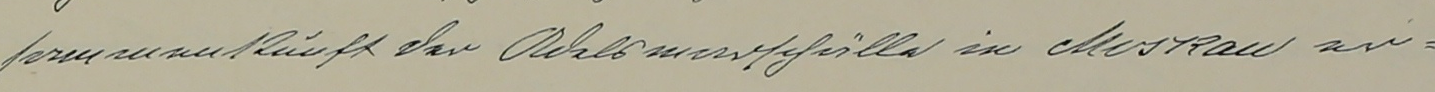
sammenkunft der Adelsmarschälle in Moskau er-
